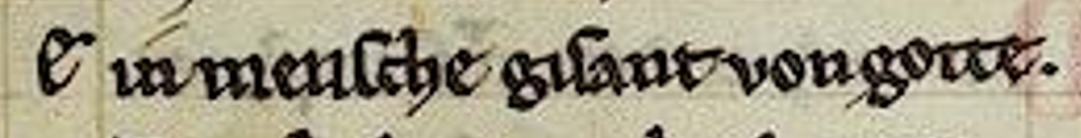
Ein menſche giſant von gotte.
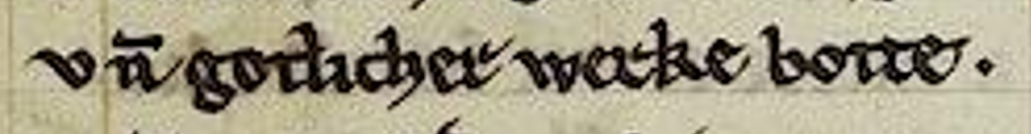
Vn(d) gotlicher werke botte.
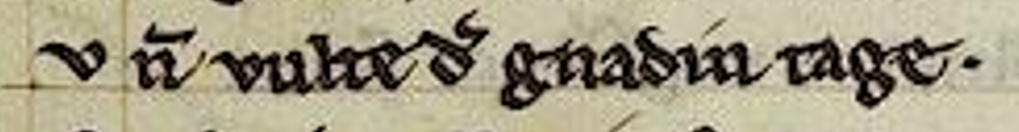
Vn(d) vulte d(er) gnadin tage.
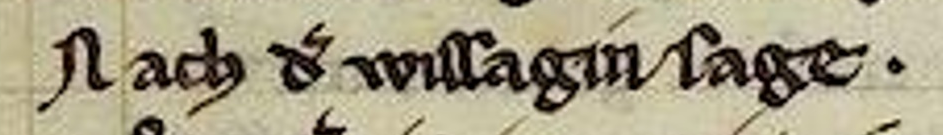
Nach d(er) wiſſagin ſage.
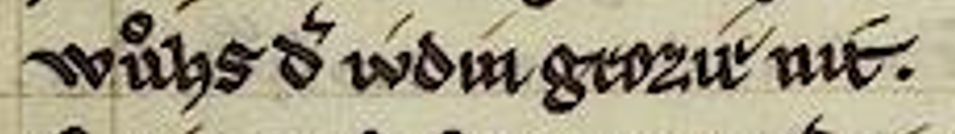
Wu°ohs d(er) ivdin grozir nit.
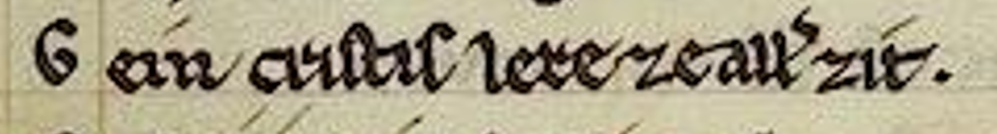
Gein criſtiſ lere ze all(er) zit.
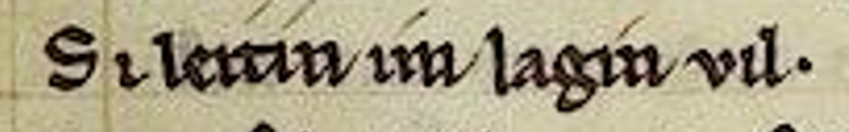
Si leitin im lagin vil.
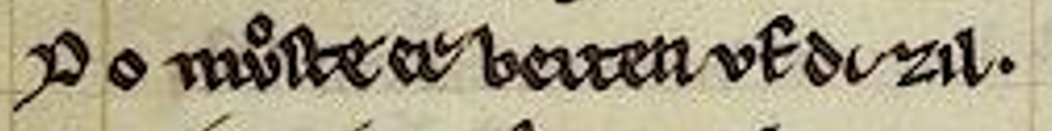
Do mv°oſte er beiten vf d(az) zil.
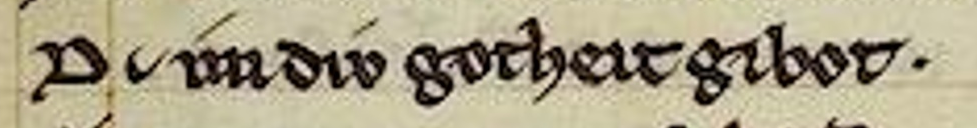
D(az) im div gotheit gibot.
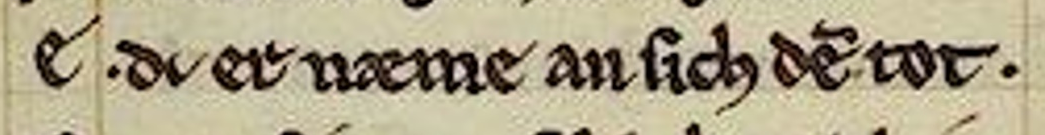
E. d(az) er n[ae]me an ſich de(n) tot.
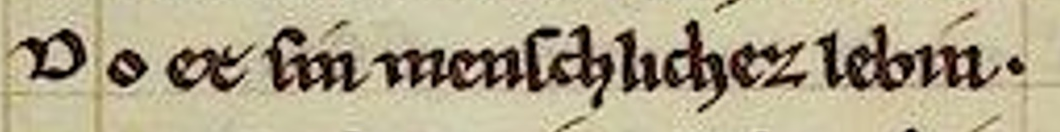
Do er ſin menſchlichez lebin.
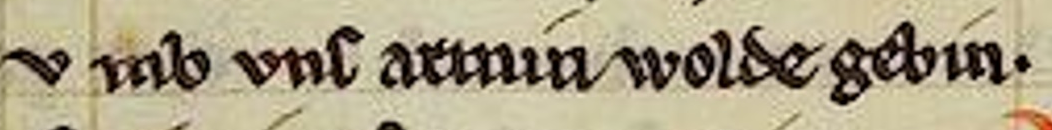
Vmb vnſ armin wolde gebin.
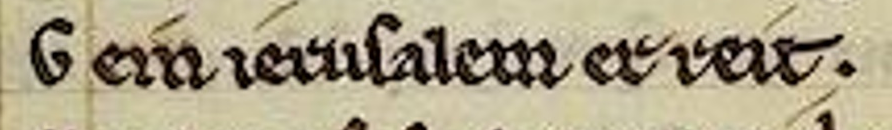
Gein ieruſalem er reit.
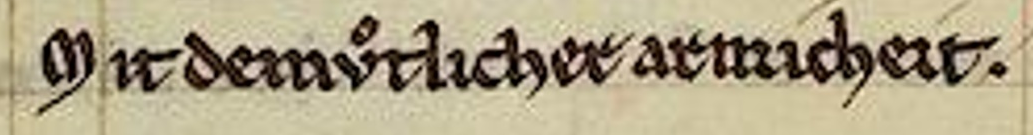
Mit demv°otlicher armicheit.
